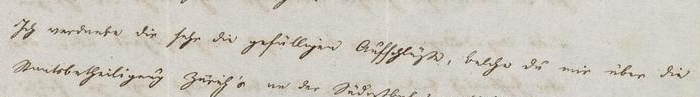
Ich verdanke Dir sehr die gefälligen Aufschlüße, welche Du mir über die
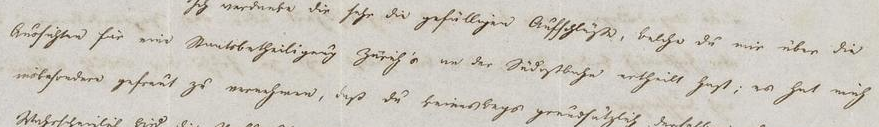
Aussichten für eine Staatsbetheiligung Zürich's an der Südostbahn ertheilt hast; es hat mich
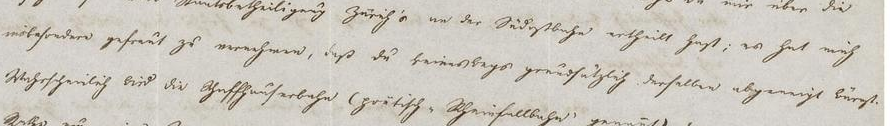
insbesondere gefreut zu vernehmen, daß Du keineswegs grundsätzlich derselben abgeneigt wärest.
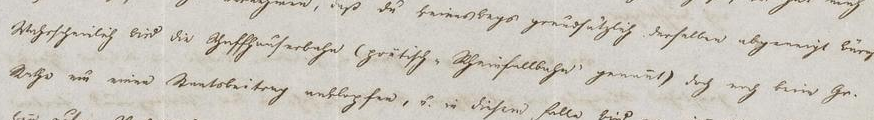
Wahrscheinlich wird die Schaffhauserbahn (poëtisch «RFB» genannt) doch noch beim Gr.
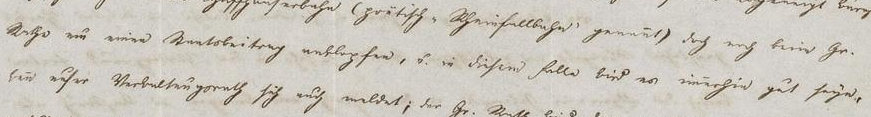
Rathe um einen Staatsbeitrag anklopfen, u. in diesem Falle wird es immerhin gut seyn,
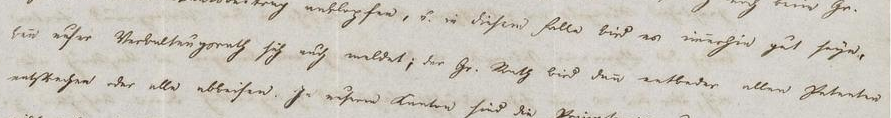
wenn unser Verwaltungsrath sich auch meldet; der Gr. Rath wird dann entweder allen Petenten
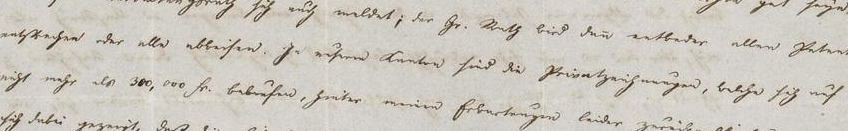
entsprechen oder alle abweisen. In unserm Kanton sind die Privatzeichnungen, welche sich auf
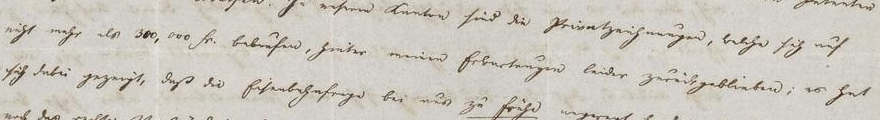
nicht mehr als 300,000 Fr. belaufen, hinter meinen Erwartungen leider zurückgeblieben; es hat
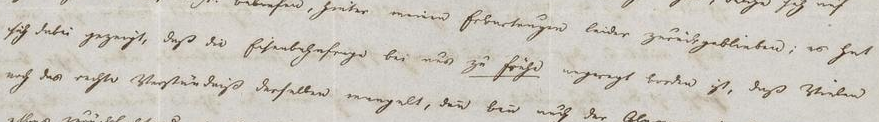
sich dabei gezeigt, daß die Eisenbahnfrage bei uns zu frühe angeregt worden ist, daß Vielen
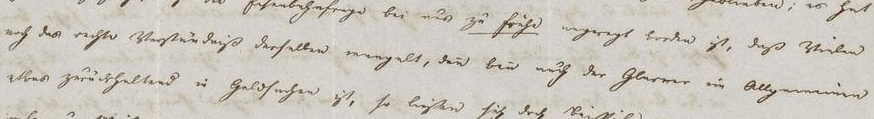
noch das rechte Verständniß derselben mangelt, denn wenn auch der Glarner im Allgemeinen
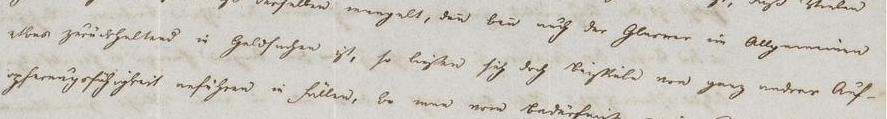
etwas zurückhaltend in Geldsachen ist, so ließen sich doch Beispiele von ganz andrer Auf-
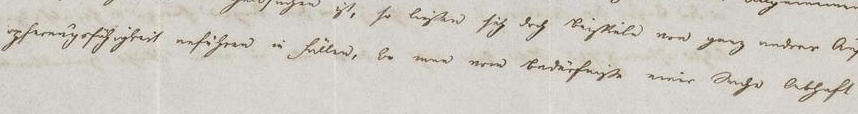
opferungsfähigkeit anführen in Fällen, wo man vom Bedürfniße einer Sache lebhaft
